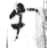午
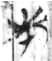未
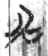申
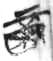梄（酉）
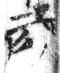戌
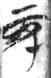亥
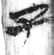子
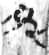丑
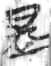是
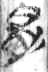{胃刀}（謂）
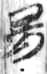昜（陽）
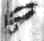日
